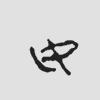女
